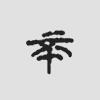不
